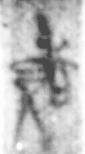騬
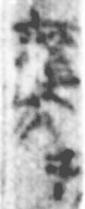騬
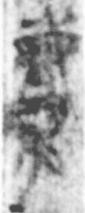○（黓）
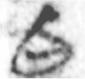白
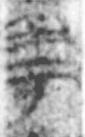○（羽）
